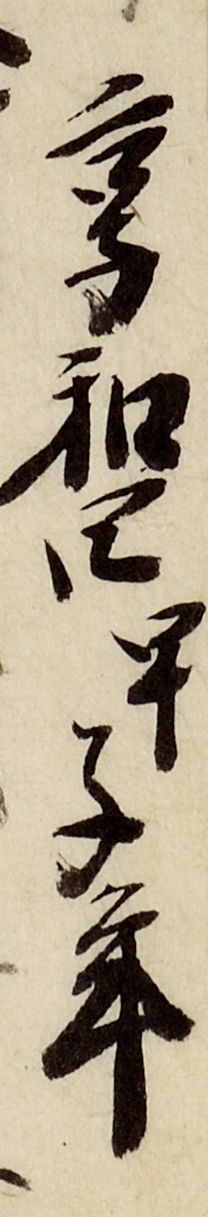享和四甲子年
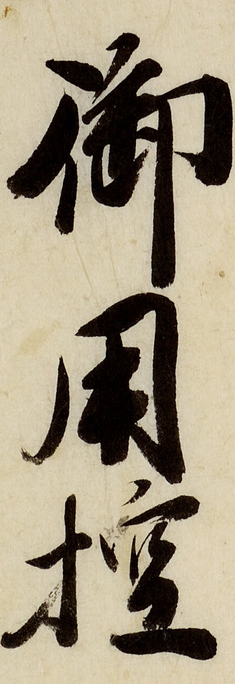御用控
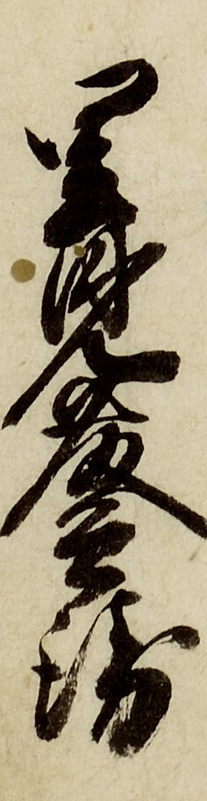里見藤兵衛
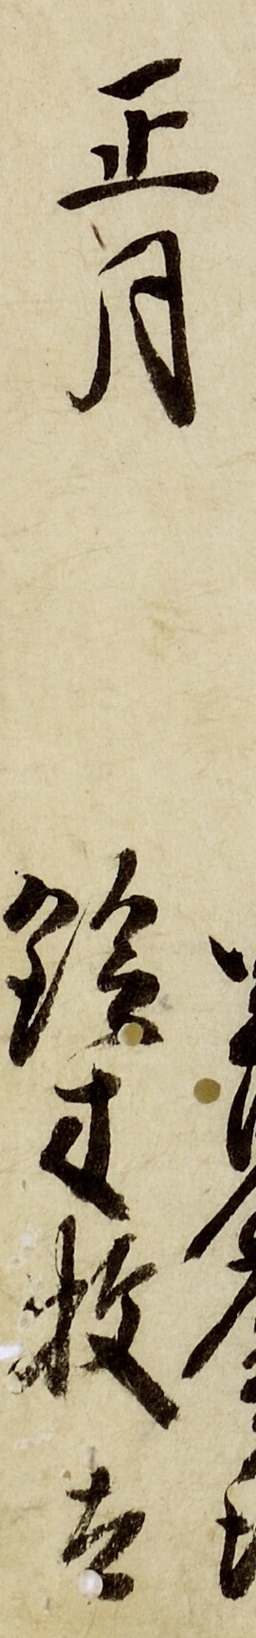正月鈴木牧太
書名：御山奉行御用控
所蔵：伊那市立高遠町図書館・合同会社AMANE
